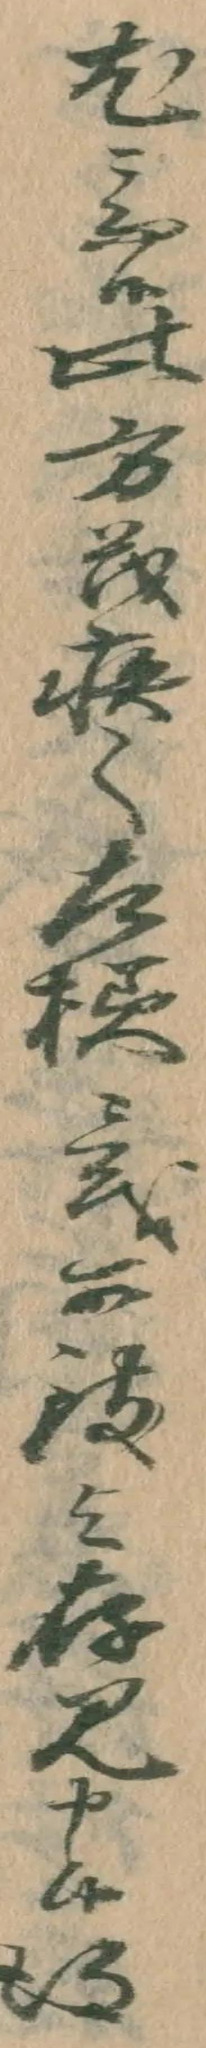尤に而候此方も疾く左様にも可致と存見申候得
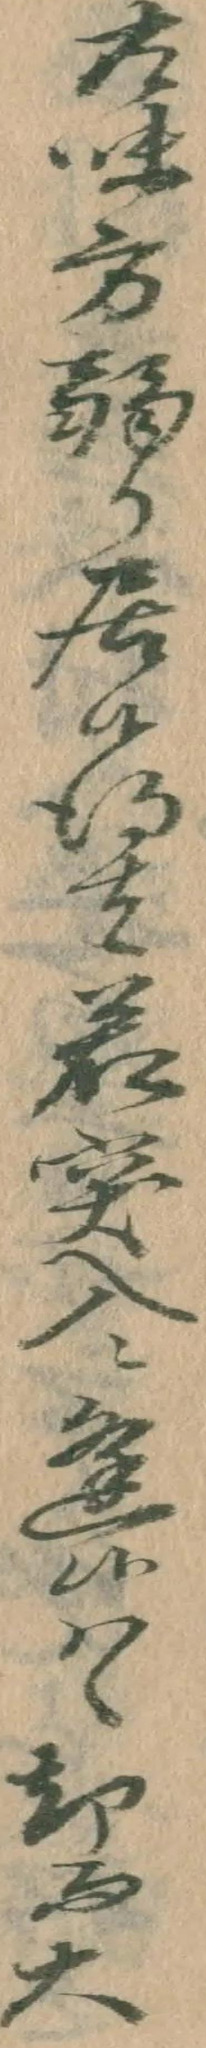共味方弱り居候得は若突入に逢候はゝ却而大
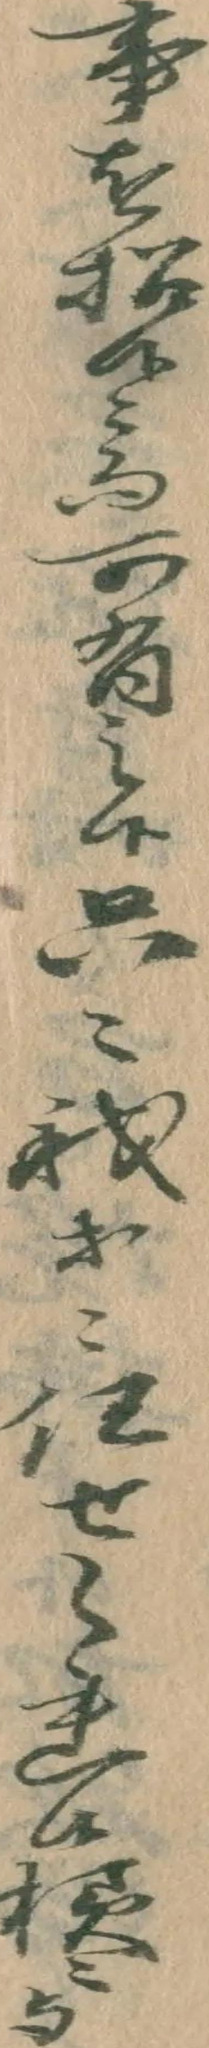事を招候に而可有之候只々我等に任せられ候様にと
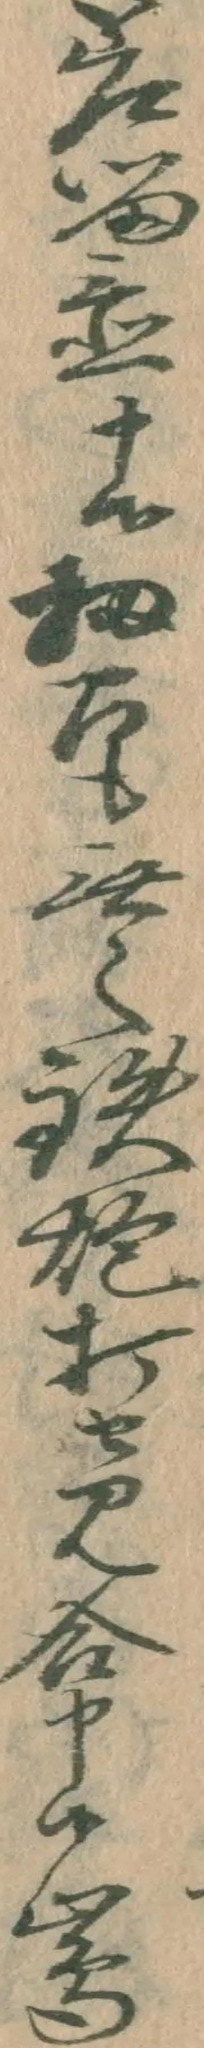差留置申候扨間も無之鉄炮打せ見合申候島
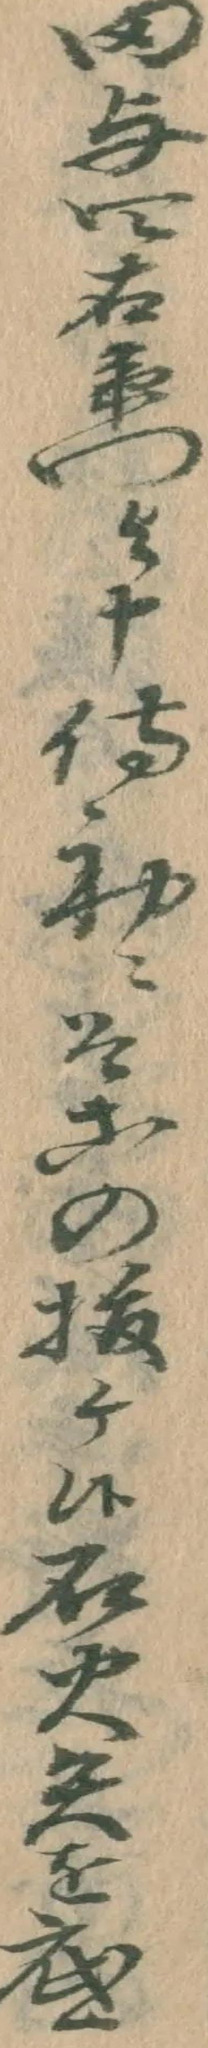田与四右衛門と申侍初にそこの抜ケ候石火矢を底
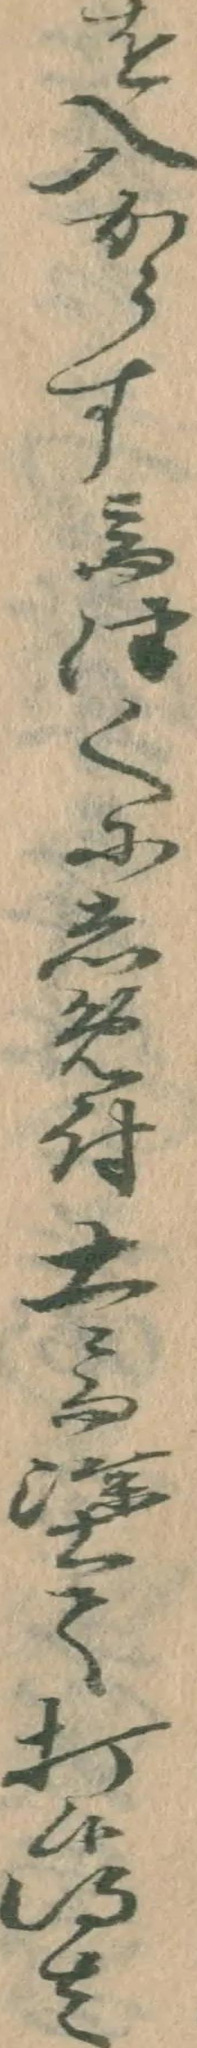を入からすに而つくにしめ付土に而塗て打候得は
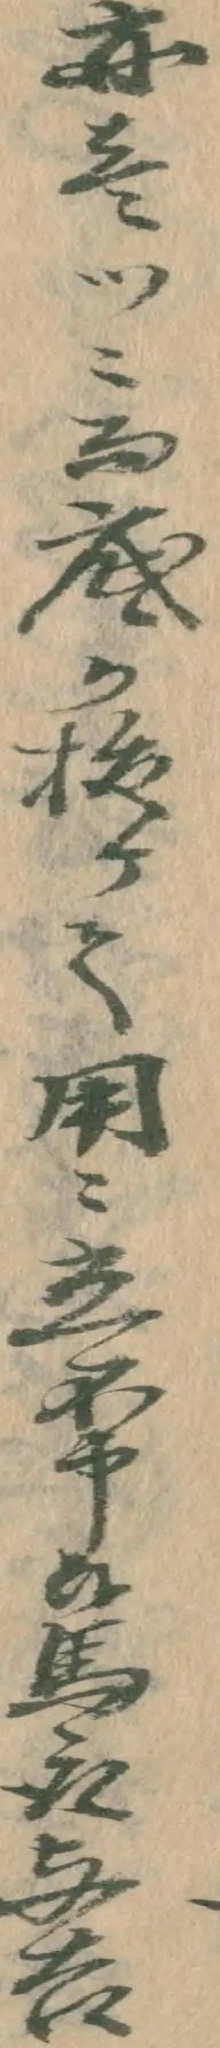亦壱ッに而底か抜ケて用に立不申候馬取与吉
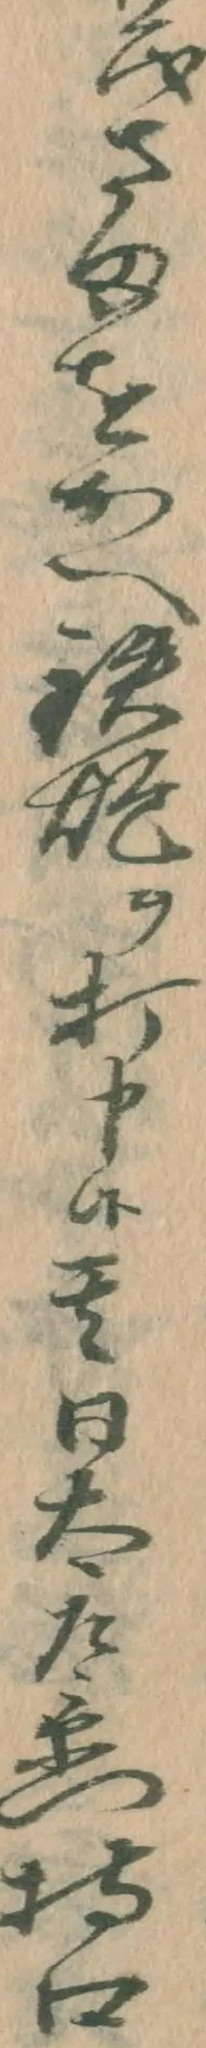もさまをかへ鉄炮ヲ打申候其日太左衛門持口

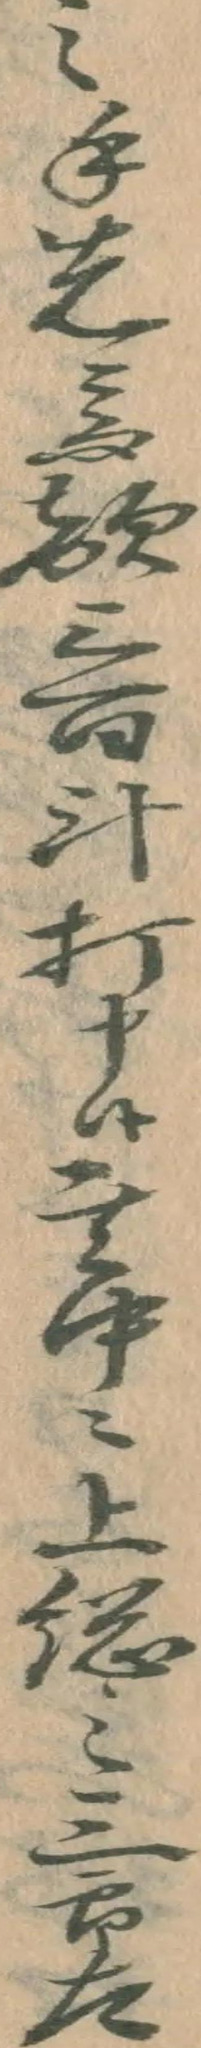之手先に而敵三百斗打申候其中に上総之三郎左
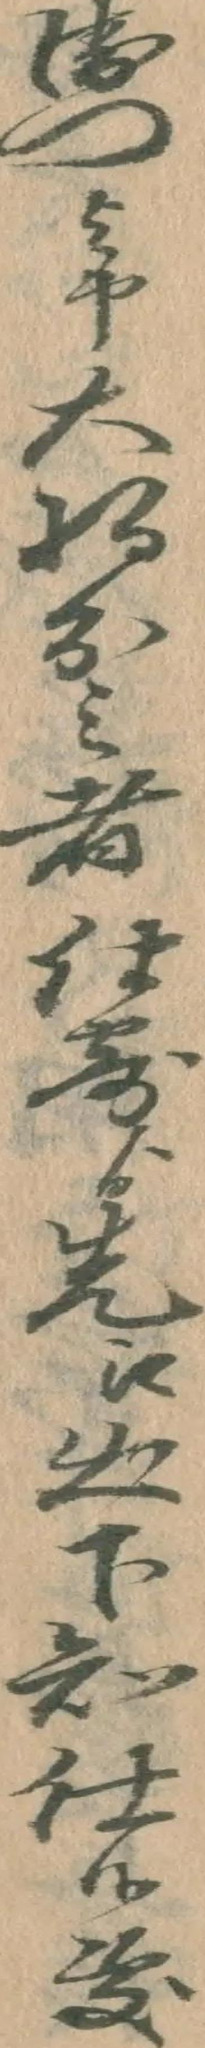衛門と申大将分之者仕寄ゟ先江出下知仕候処
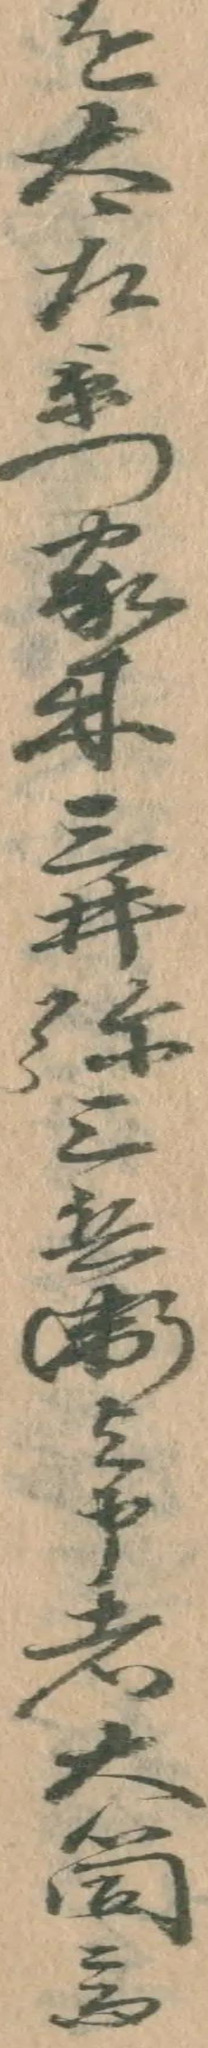を太左衛門家来三井弥三兵衛と申者大筒に而
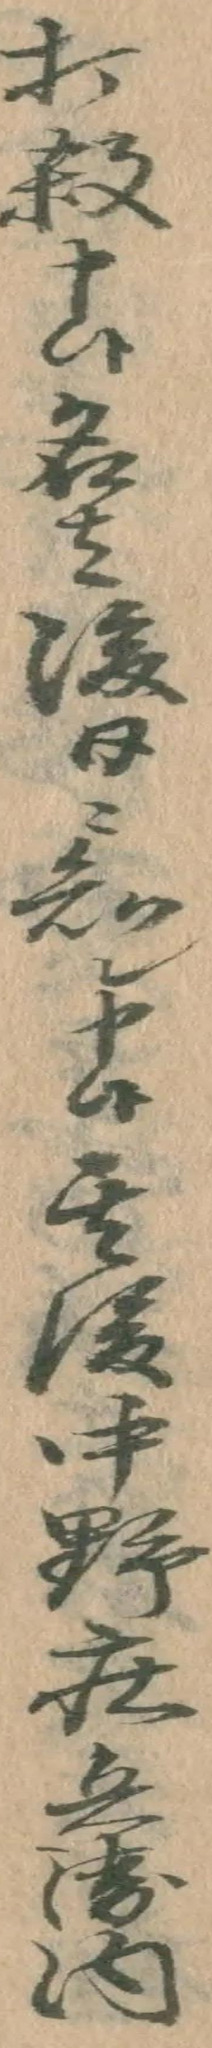打殺申候名は後日に知レ申候其後中野庄兵衛内
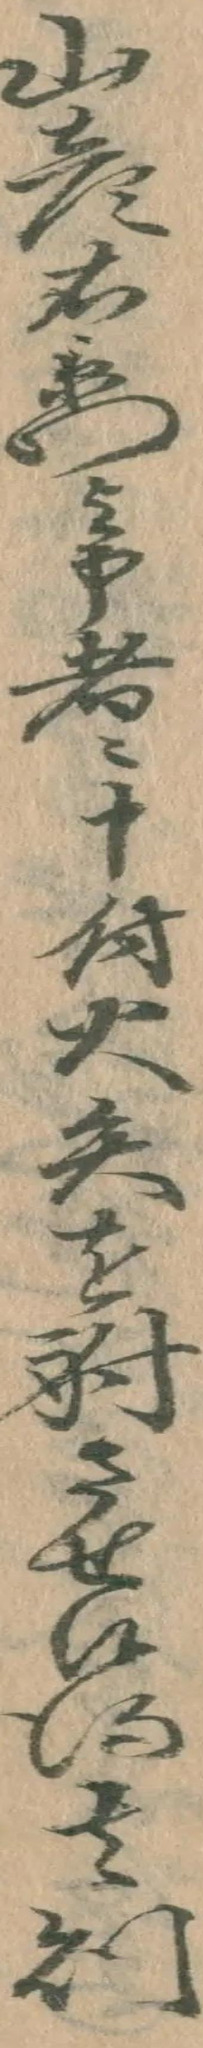山彦右衛門と申者に申付火矢を射させ候得は則
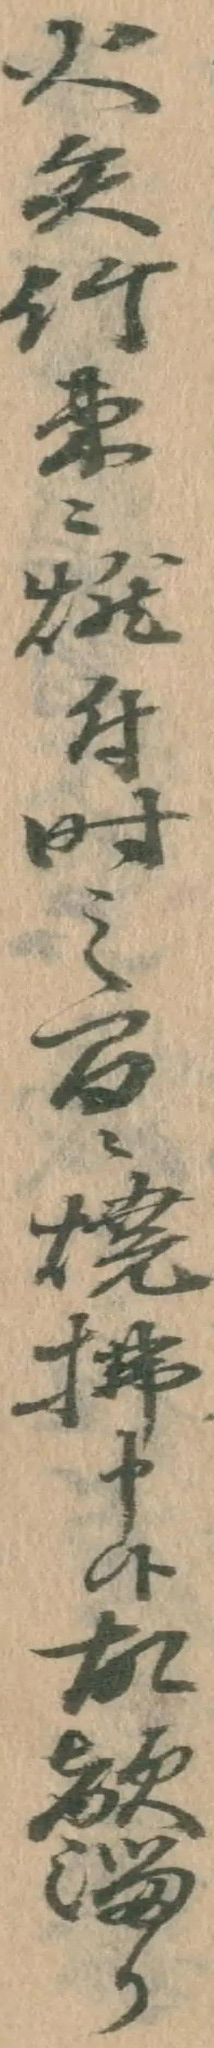火矢竹束に燃付時之間に焼払申候故敵溜り
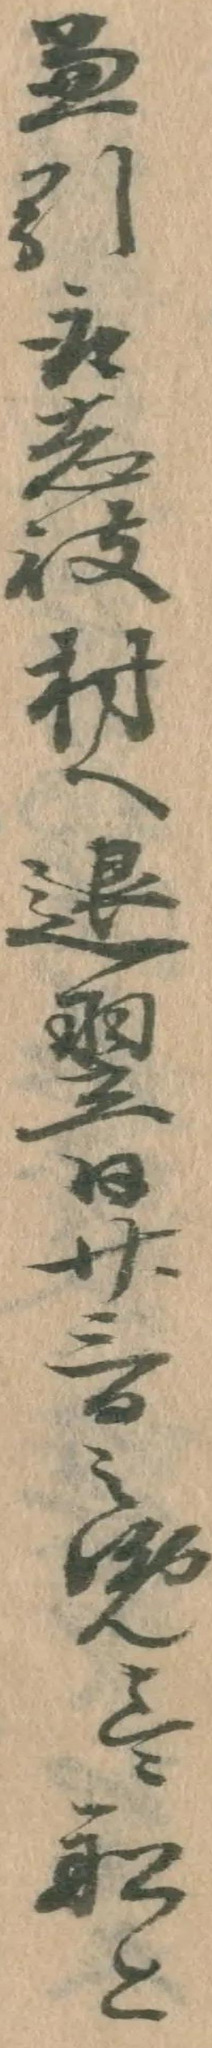兼引取志岐村へ退翌日廿三日之晩迄に船と
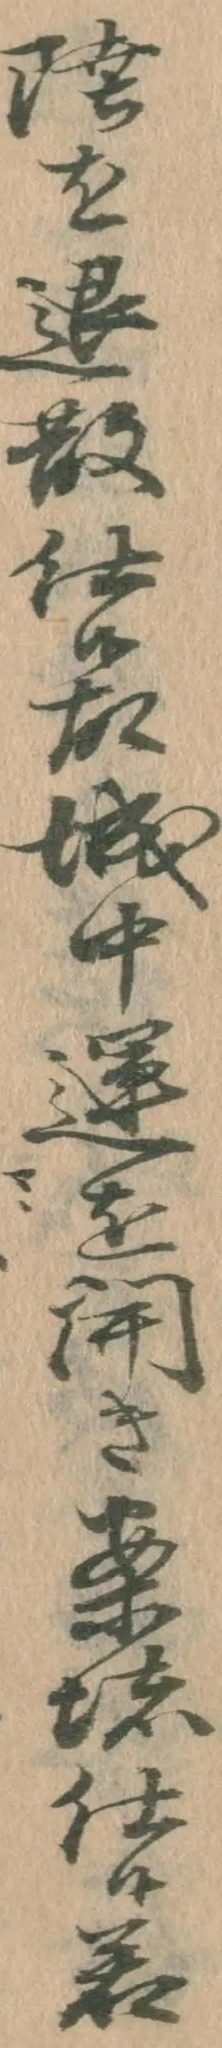陸を退散仕候故城中運を開き安堵仕候若
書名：切支丹御退治記 49巻. [3]
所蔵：国立国会図書館 National Diet Library, JAPAN
